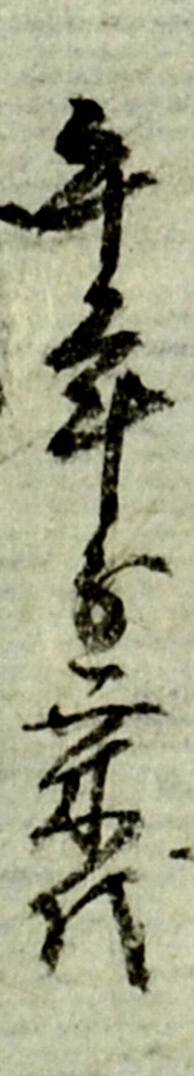午年分桑代
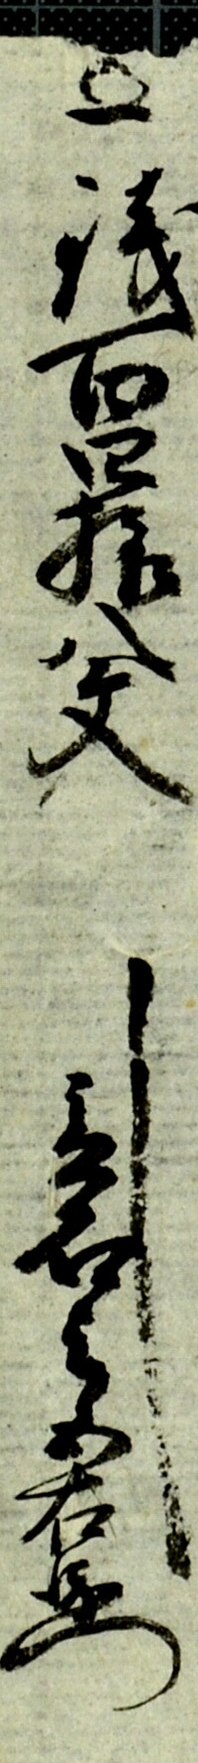○一銭百四拾八文立石与五右衛門
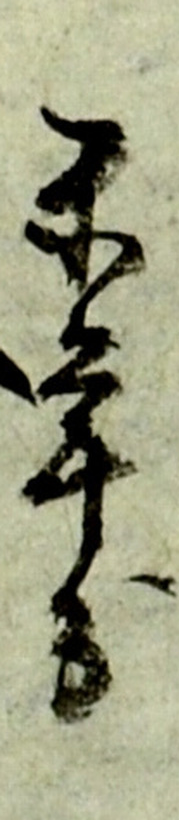未年分
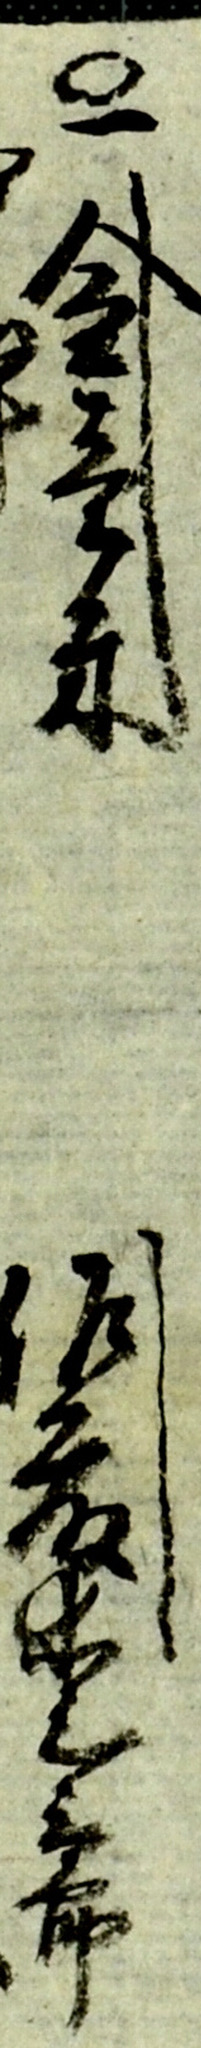○一金壱朱佐藤愛三郎
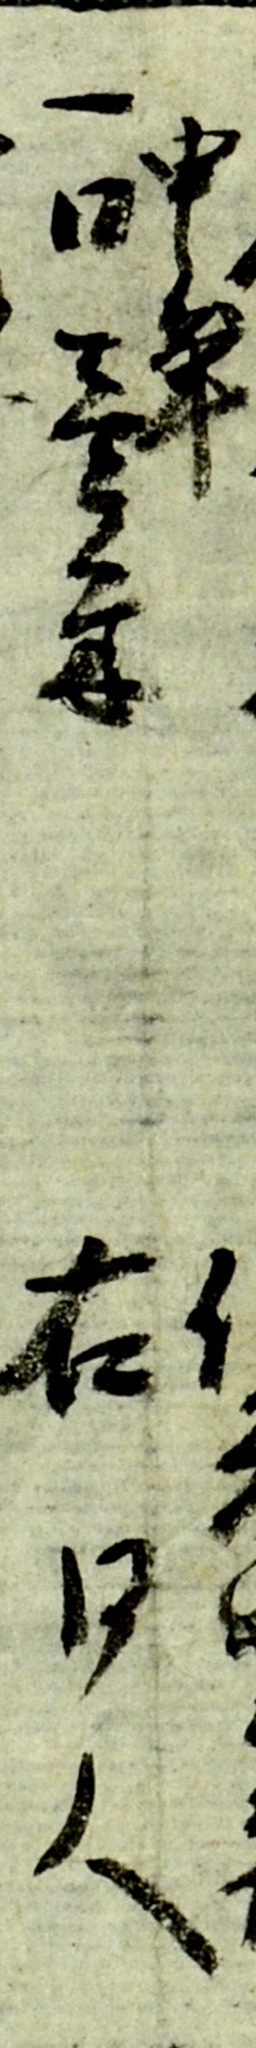一同壱朱右同人
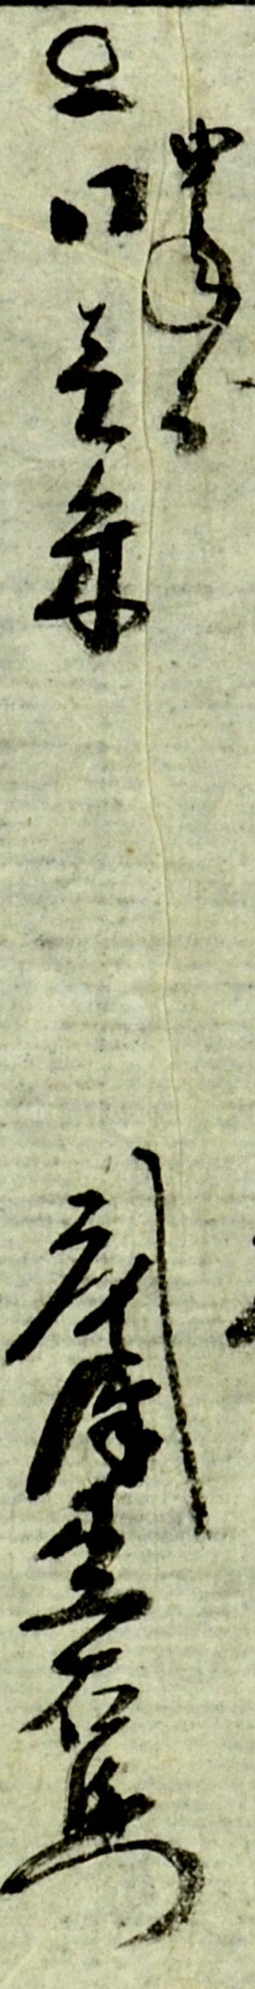○一同壱朱唐沢杢右衛門
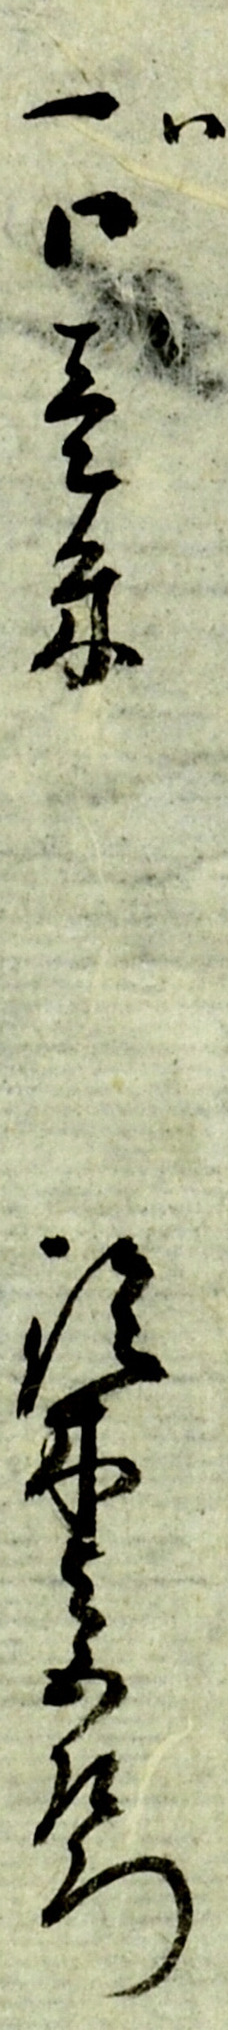一同壱朱鈴木与五左衛門
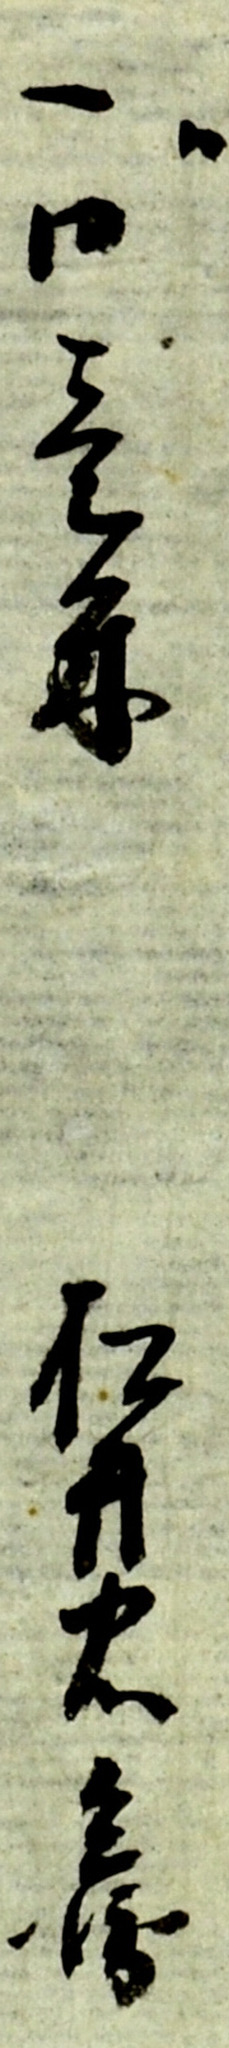一同壱朱松井忠兵衛
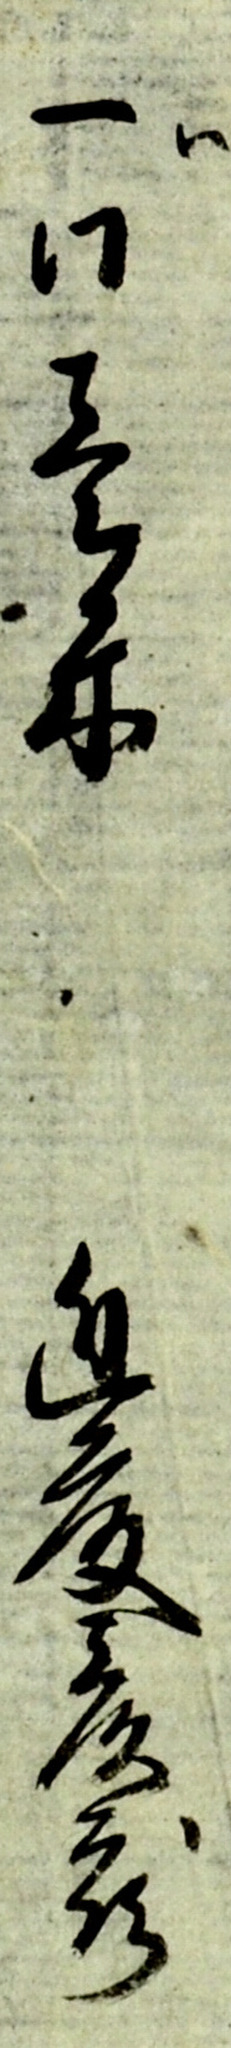一同壱朱近藤彦蔵
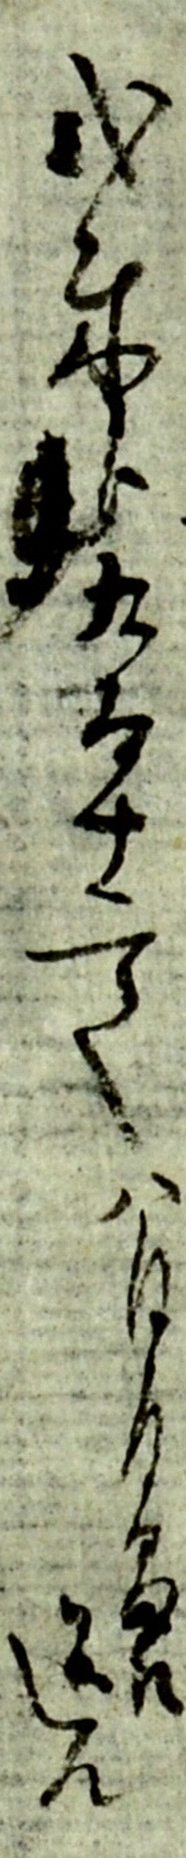弐朱ト九百十二文八月月番え

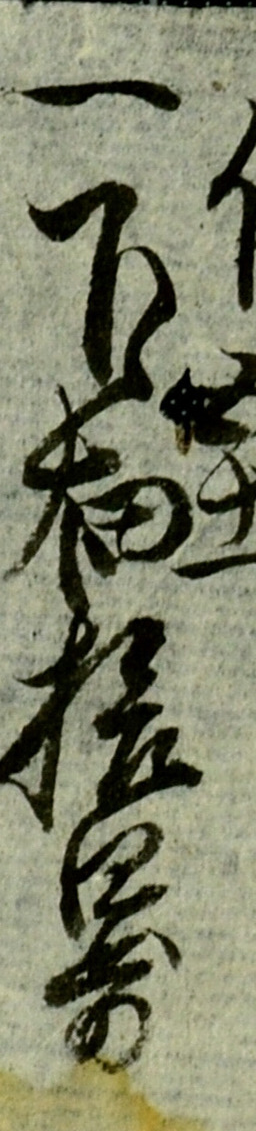一下々畑拾四歩
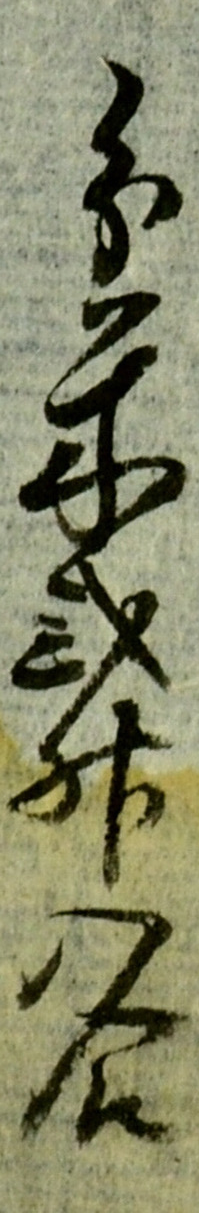分米弐升八合
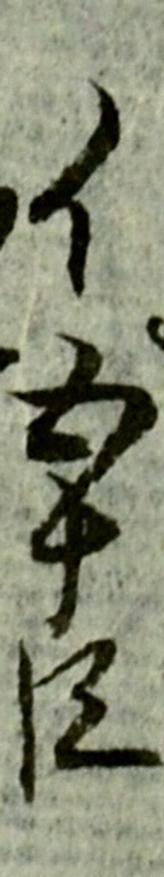イ五十四
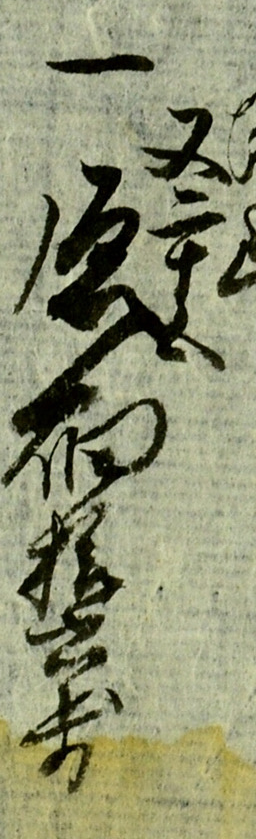一原畑拾六歩
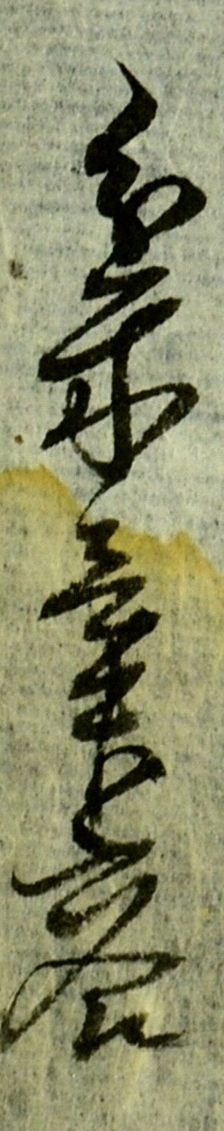分米壱升六合
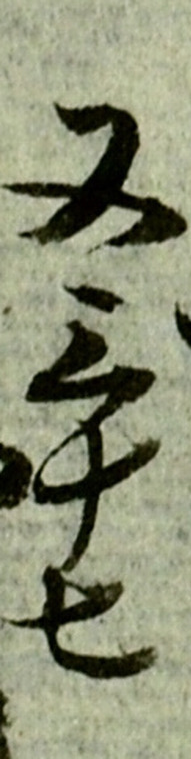五三十七
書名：覚
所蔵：伊那市立高遠町図書館・合同会社AMANE
